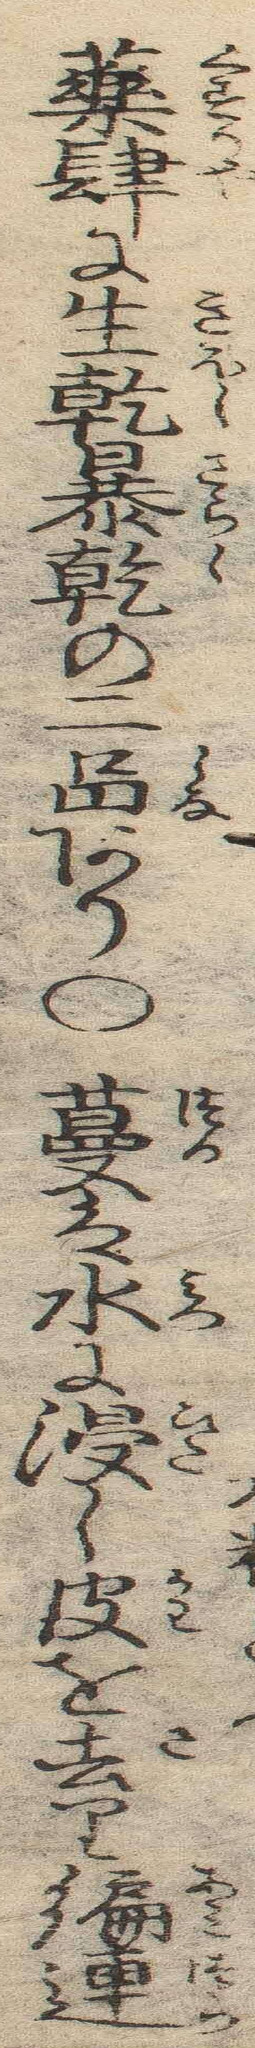薬肆に生乾暴乾の二品あり○蔓は水に浸し皮を去り編連

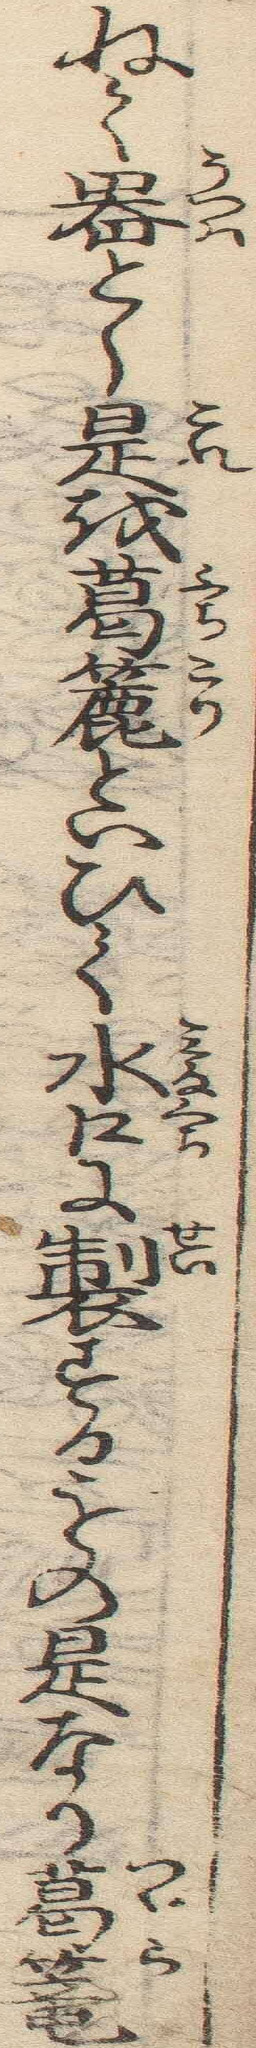ねて器とし是を葛簏といひて水口に製するもの是なり葛篭
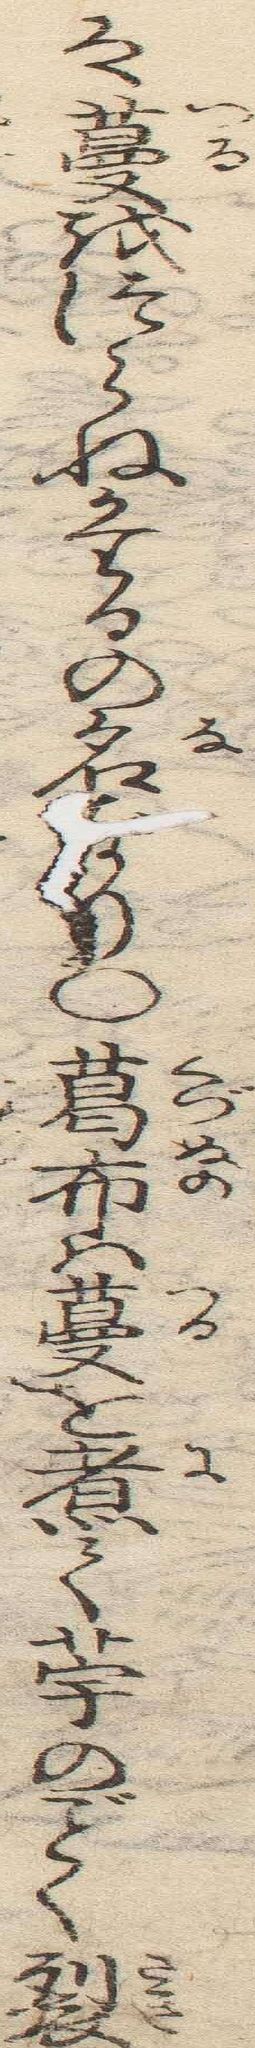は蔓をつらねたるの名なり○葛布は蔓を煮て荢のごとく裂
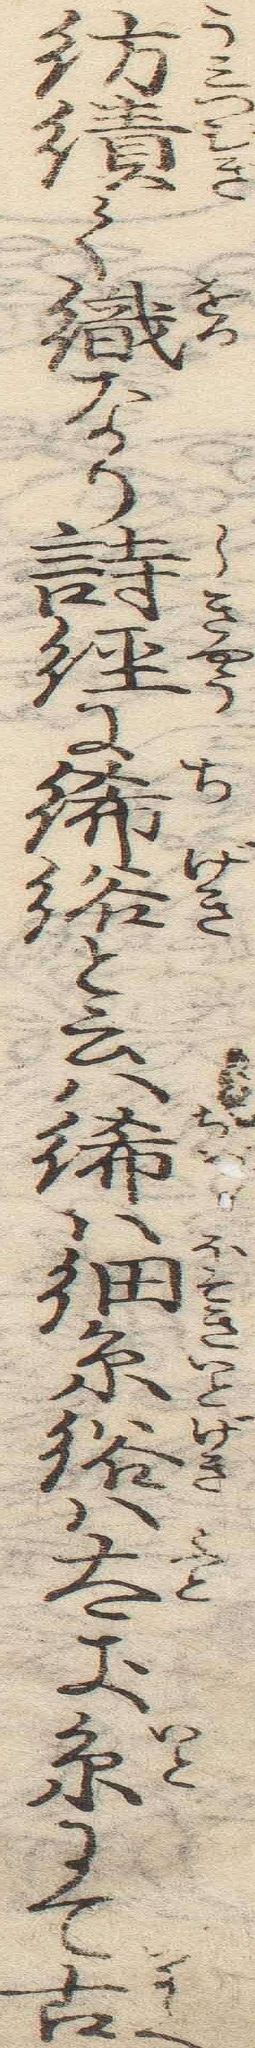紡績て織なり詩経に絺綌と云は絺は細糸綌は太き糸にて古
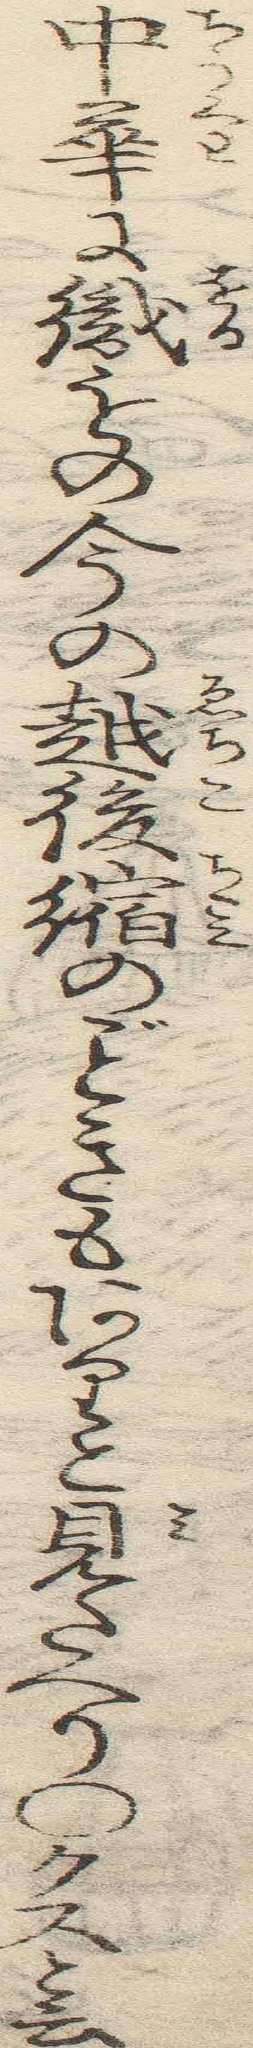中華に織もの今の越後縮のごときもありと見たへり○クスと云
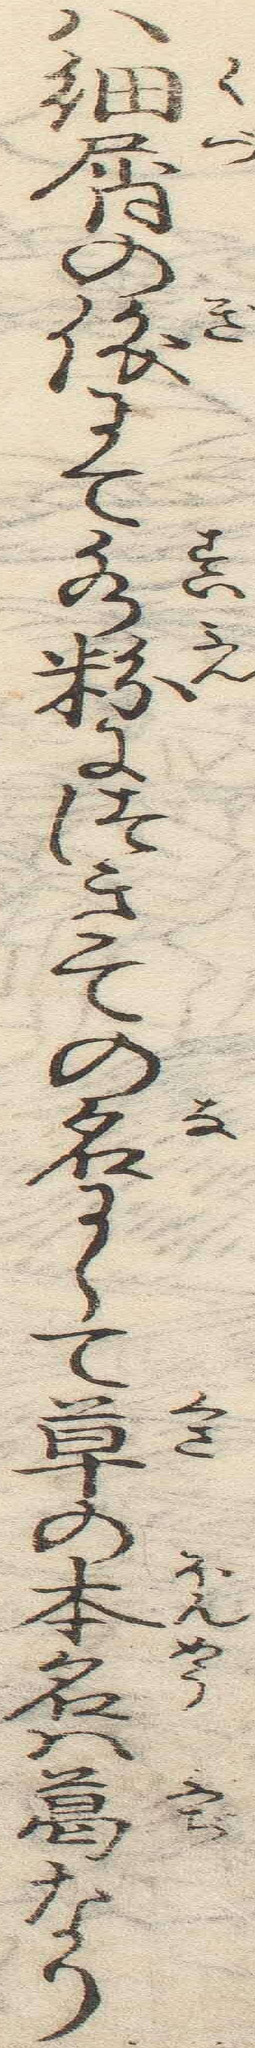は細屑の儀にて水粉につきての名にして草の本名は葛なり
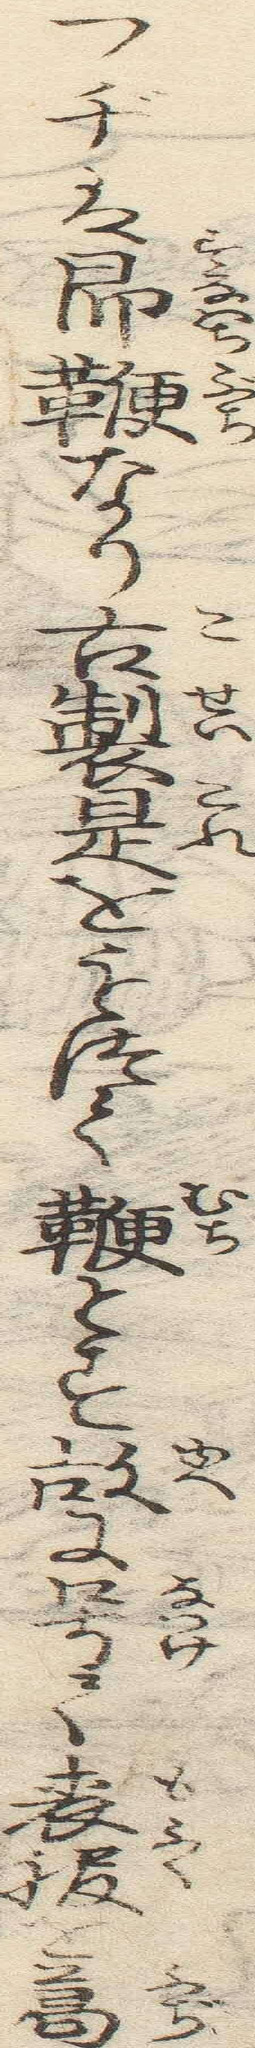フヂは即鞭なり古製是をもつて鞭とす故に号て喪服を葛
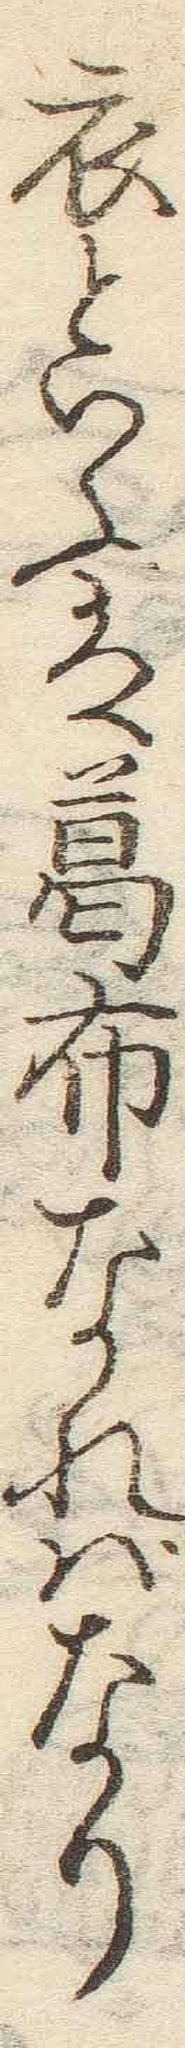衣といふは葛布なればなり
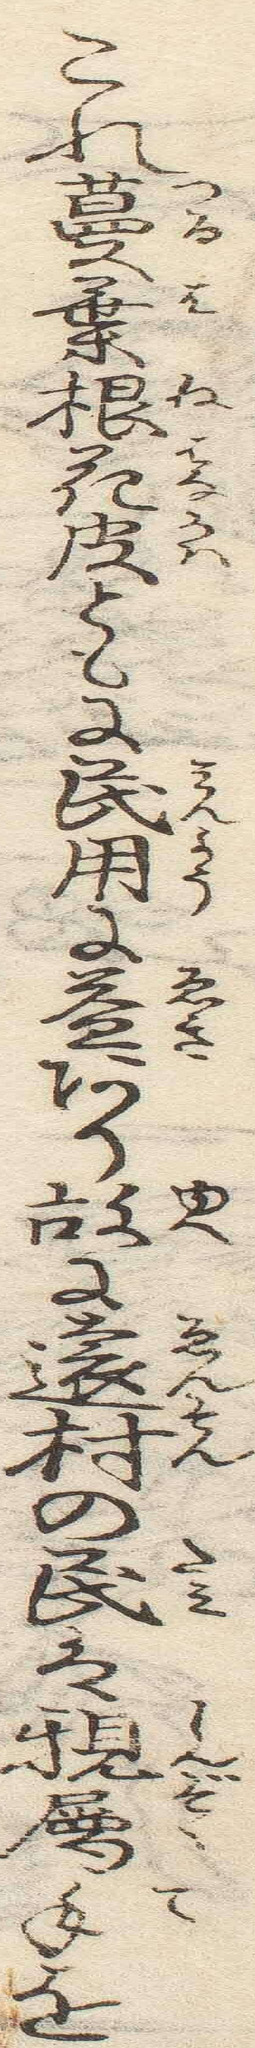これ蔓葉根花皮ともに民用に益あり故に遠村の民は親属手を
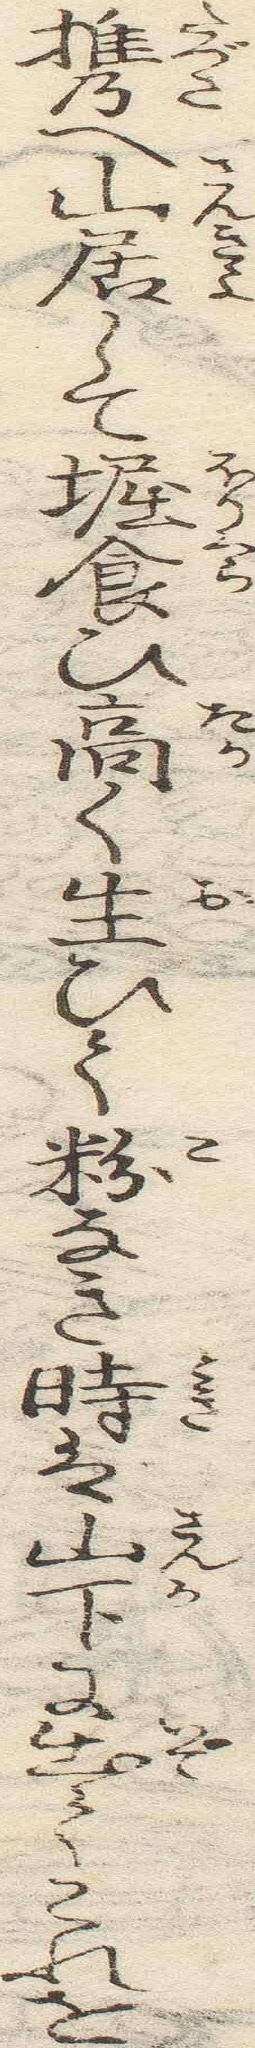携へ山居して堀食ひ高く生ひて粉なき時は山下に出てこれを
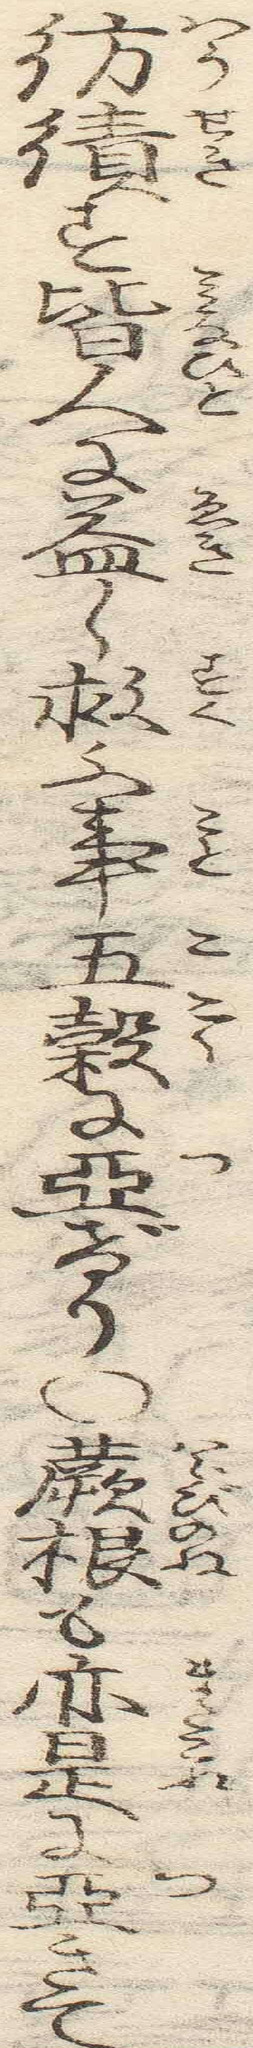紡績す皆人に益し救ふ事五穀に亞げり○蕨根も亦是に亞きて
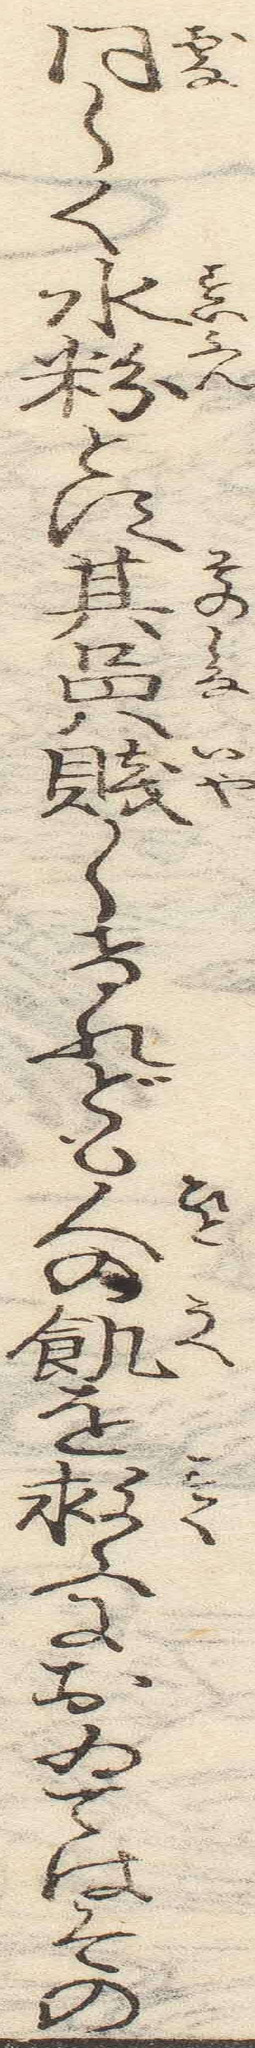同しく水粉とす其品は賤しけれども人の飢を救ふにおゐてはその
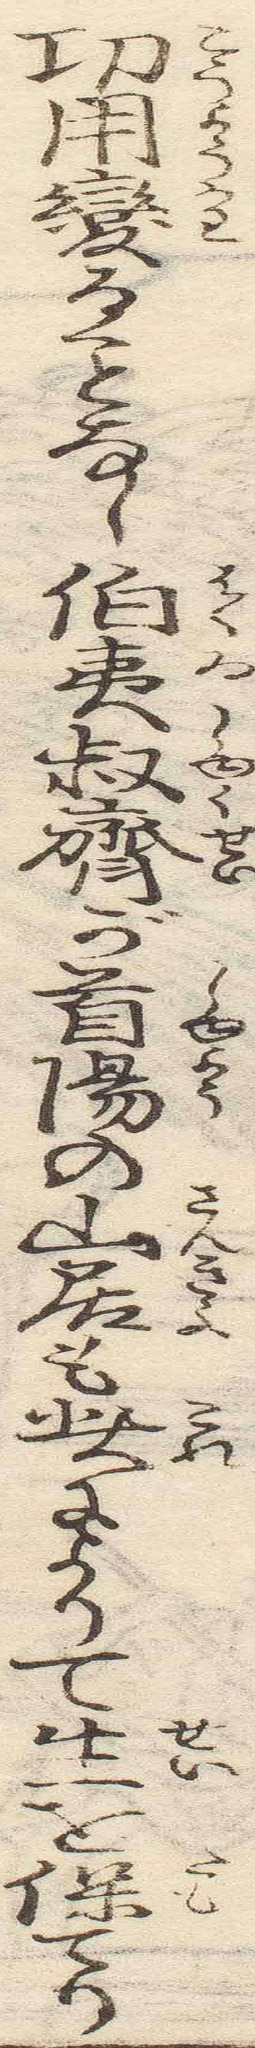功用変ることなし伯夷叔斉が首陽の山居も此によりて生を保てり
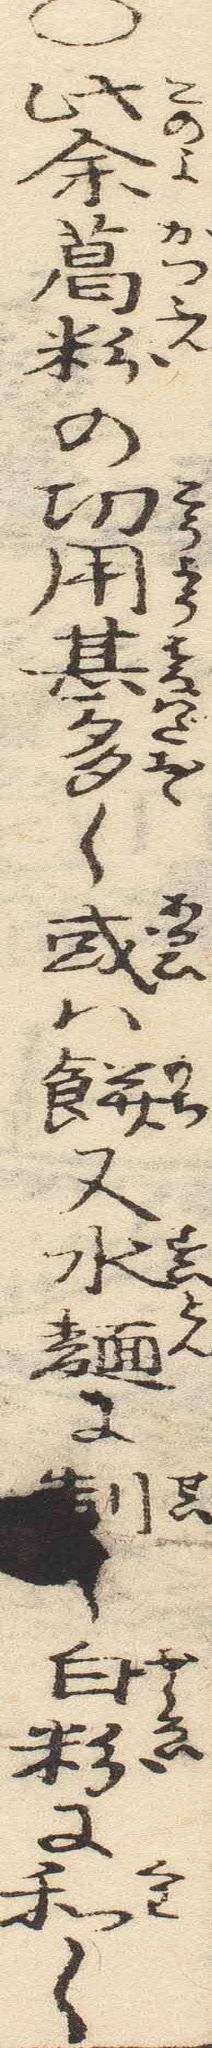○此余葛粉の功用甚多し或は餅又水麺に制し白粉に和し
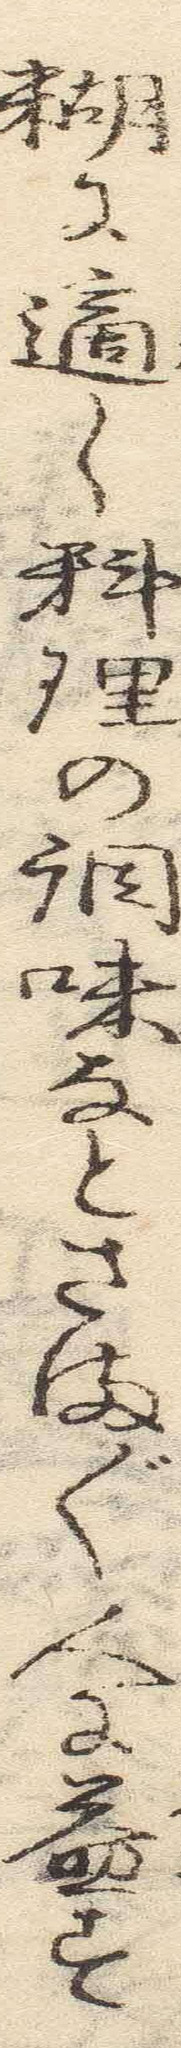糊に適し料理の調味なとさま〴〵人に益す
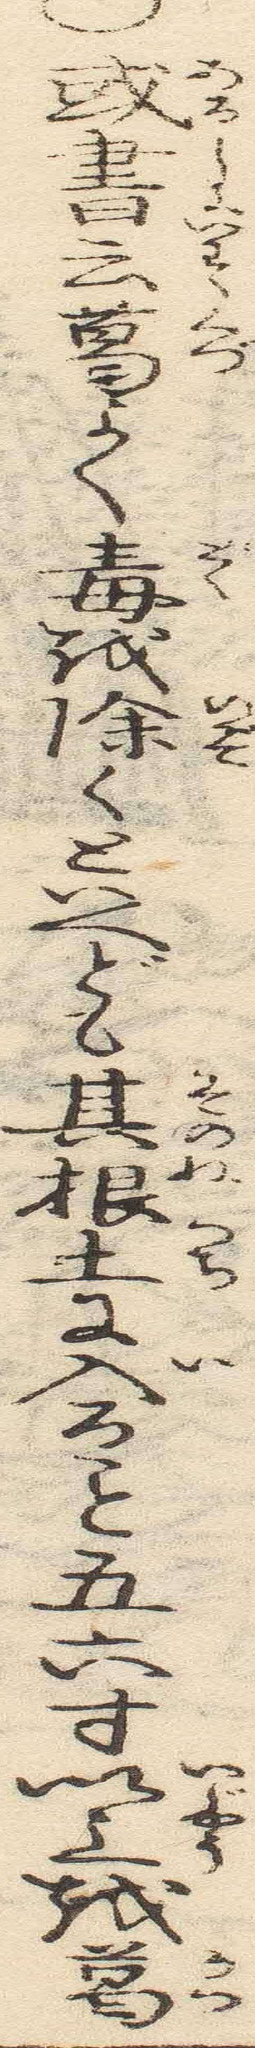○或書云葛よく毒を除くといへども其根土に入ること五六寸以上を葛
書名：日本山海名産図会
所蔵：東京学芸大学附属図書館 国文学研究資料館
